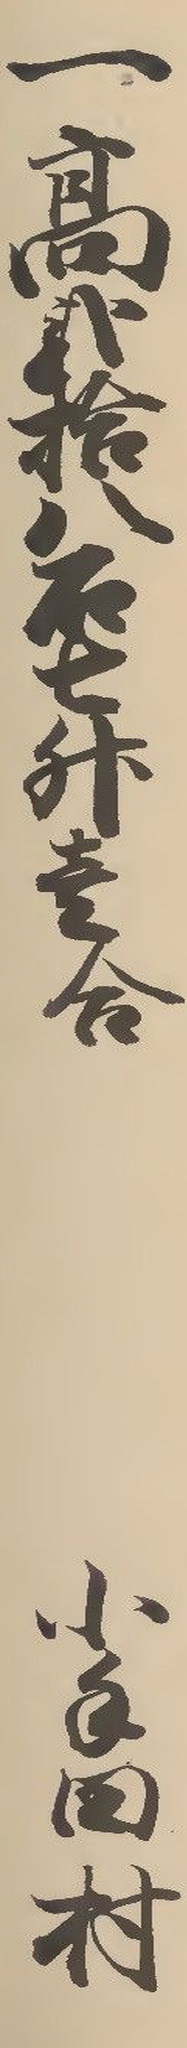一髙弐拾八石七升壱号小手田村
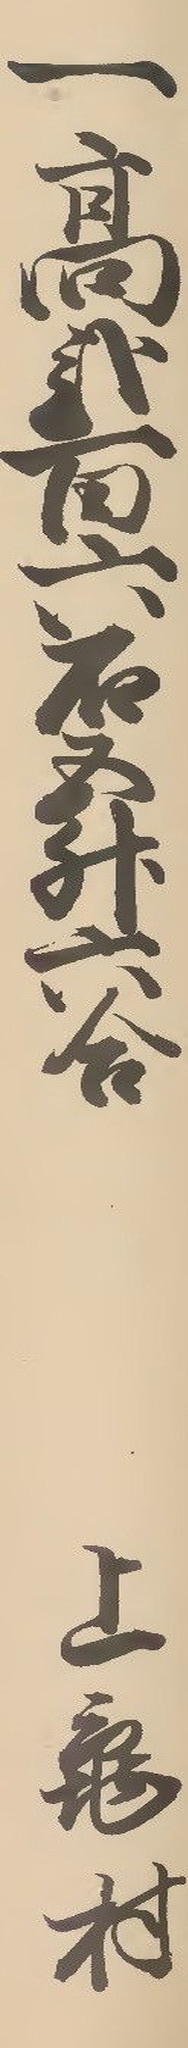一髙弐百六石五升六合上龜村
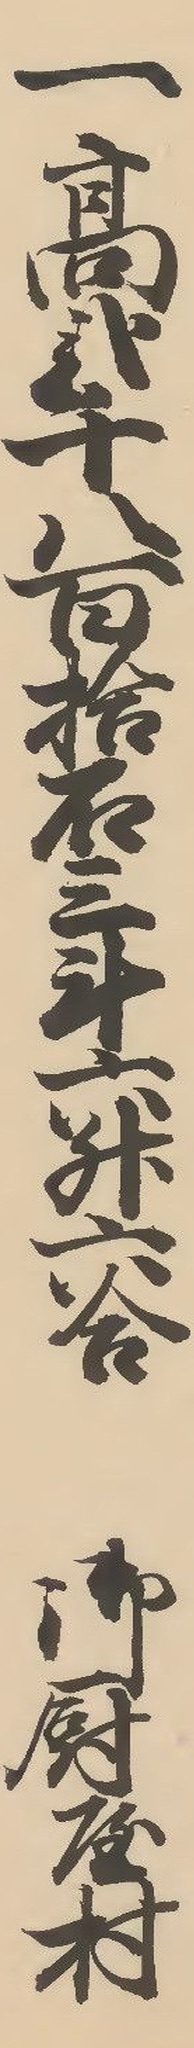一髙弐千八百拾石三斗六升六合御厨屋村
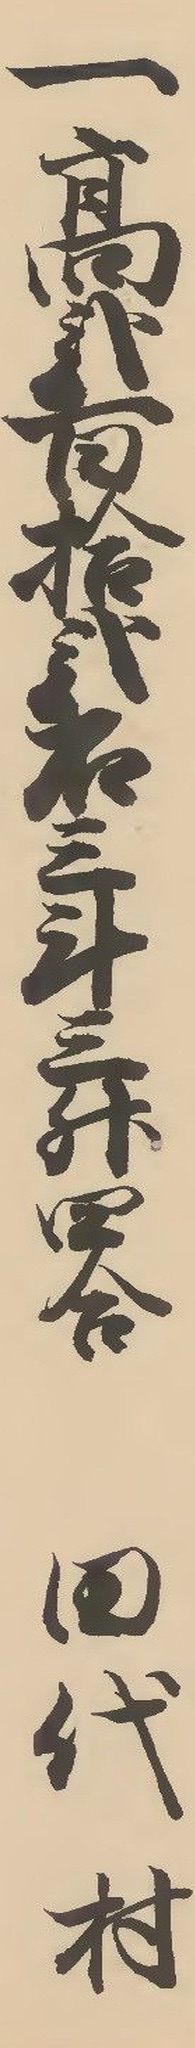一髙弐百拾弐石三斗三升四合田代村
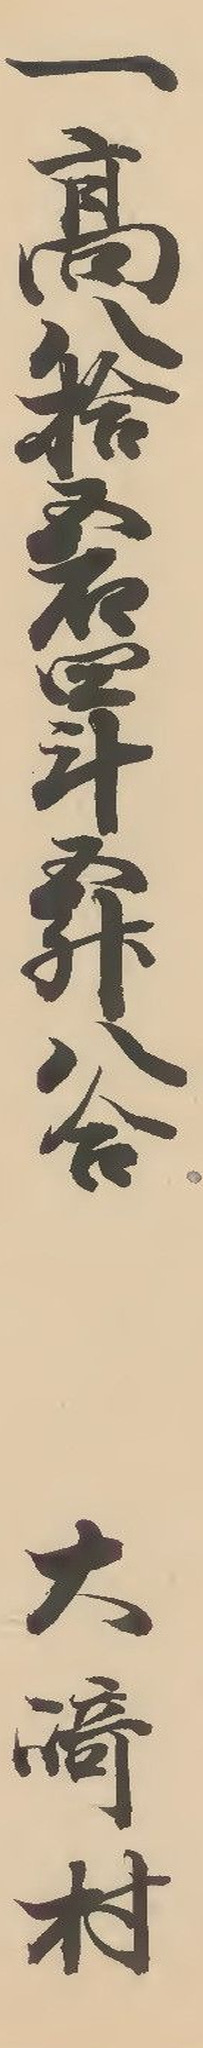一髙八拾五石四斗五升八合大崎村

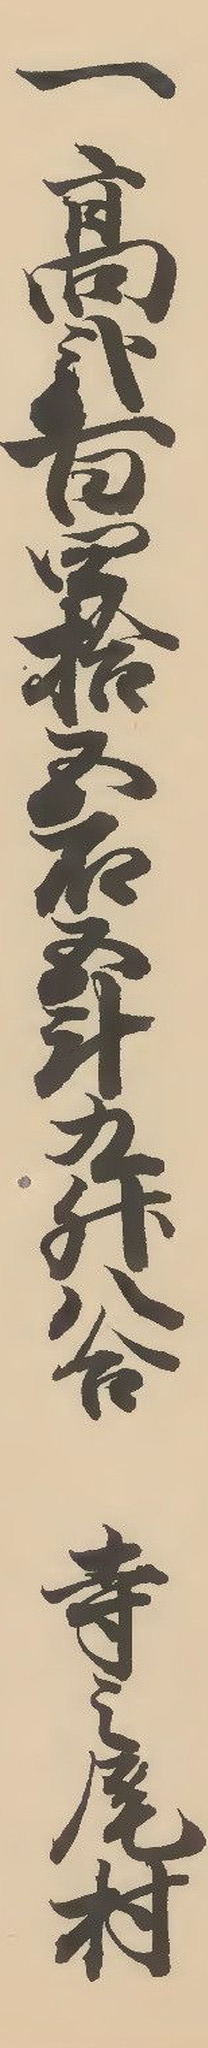一髙弐百四拾五石五斗九升八合寺之尾村
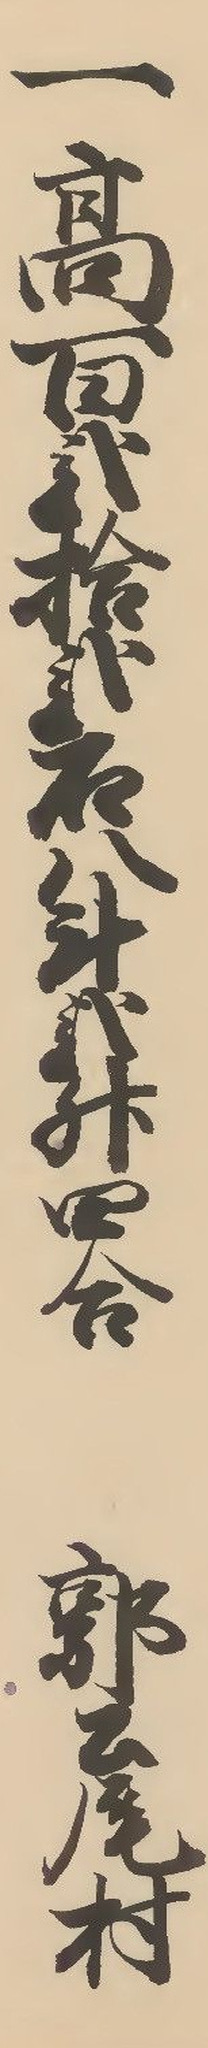一髙百弐拾弐石八斗弐升四合郭尾村
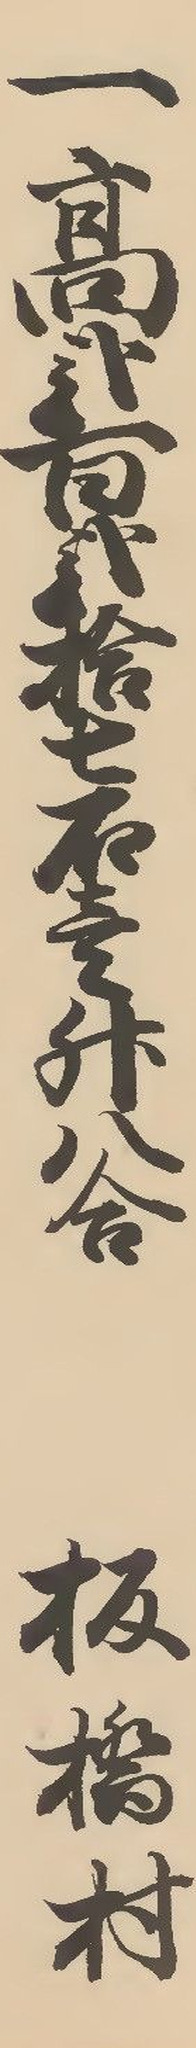一髙弐百弐拾七石壱升八合板橋村
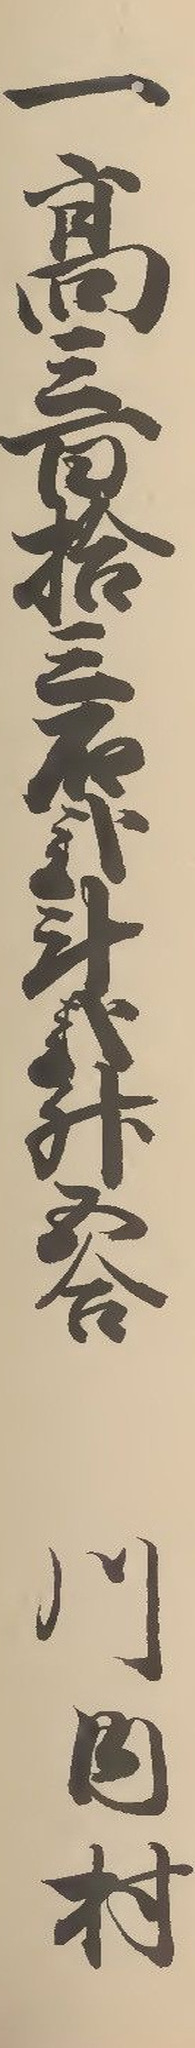一髙三百拾三石弐斗弐升五合川内村
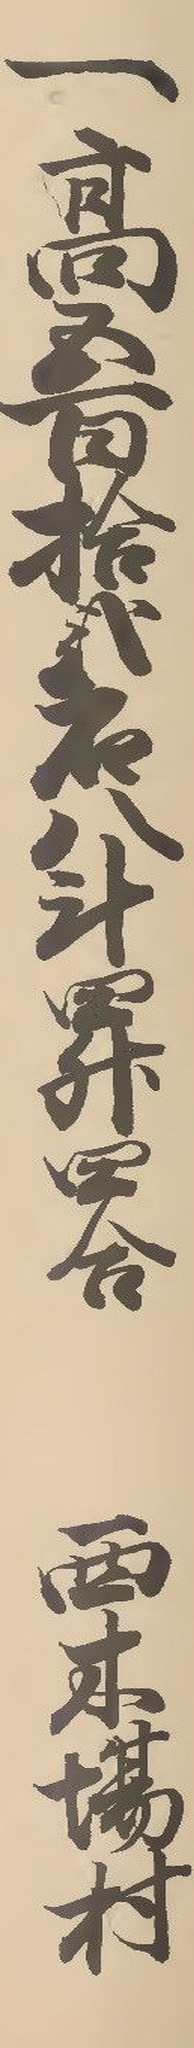一髙五百拾弐石八斗四升四合西木場村
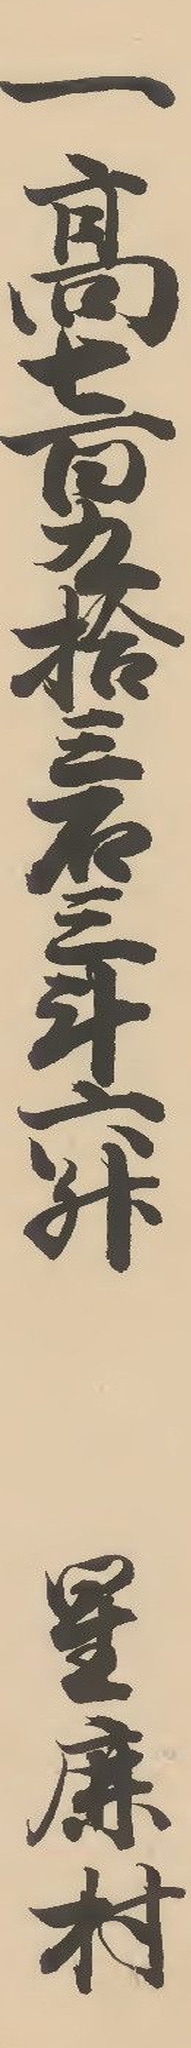一髙七百九拾三石三斗六升星鹿村
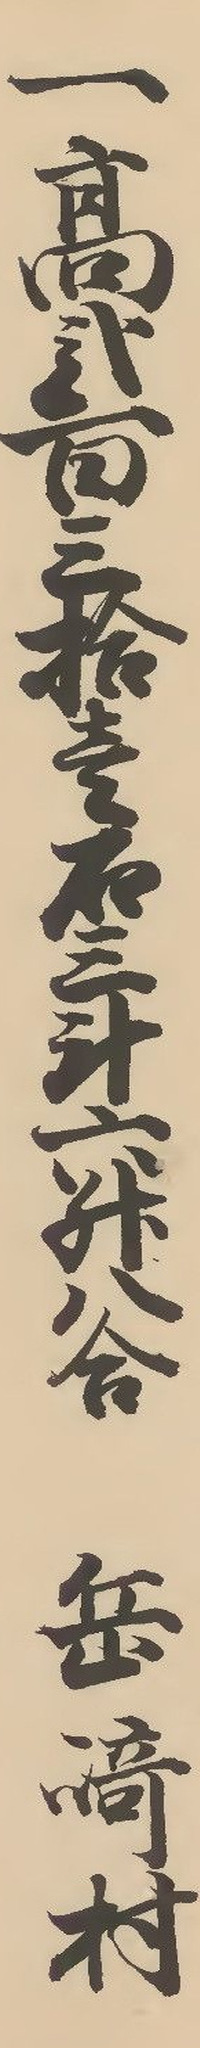一髙弐百三拾壱石三斗六升八合岳崎村
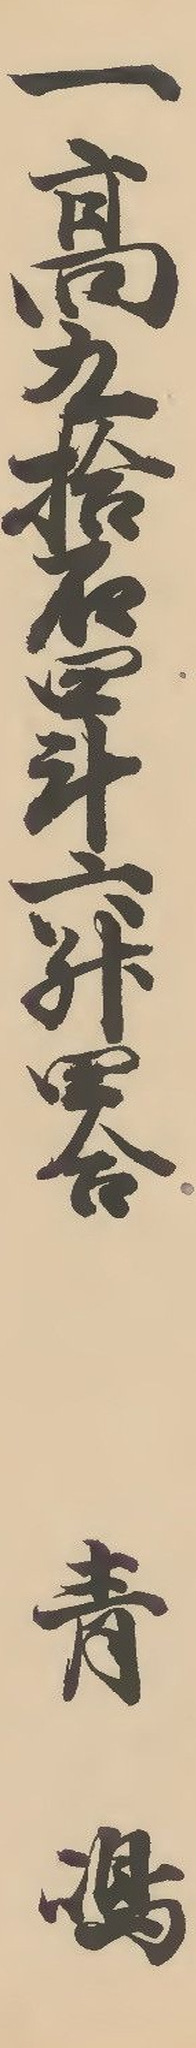一髙九拾石四斗六升四合青嶋

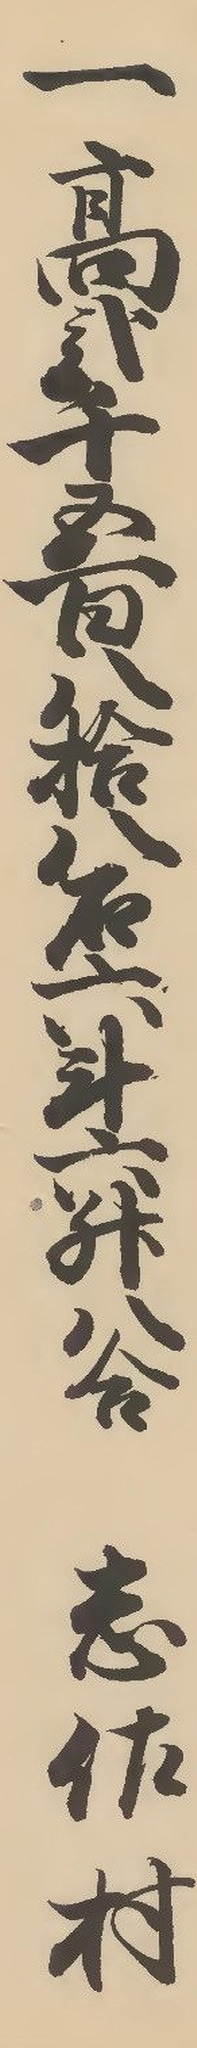一髙弐千五百八拾八石六斗六升八合志佐村
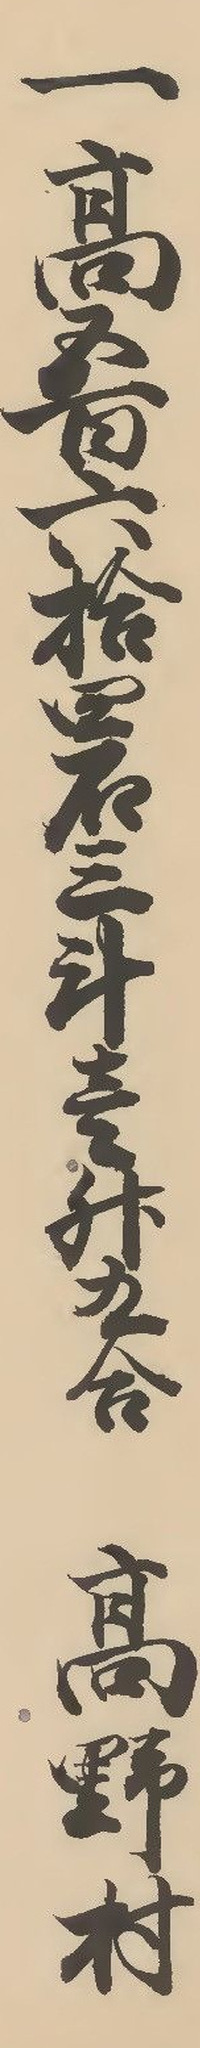一髙五百六拾四石三斗壱升九合髙野村
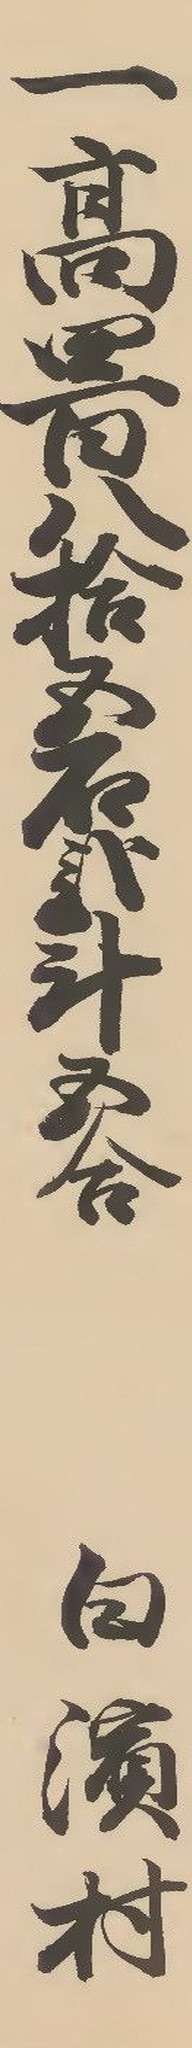一髙四百八拾五石弐斗五合白濱村
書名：肥前国郷帳
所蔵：国立公文書館 National Archives of Japan
